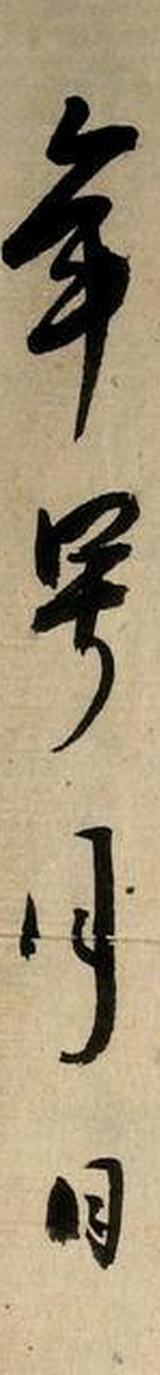年号月日
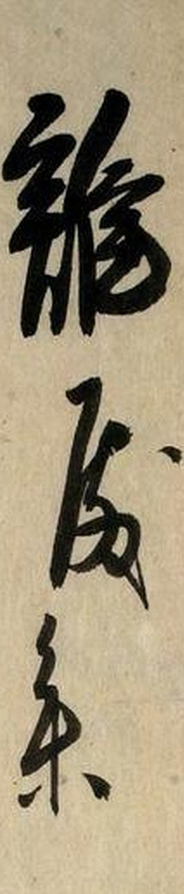誰殿参
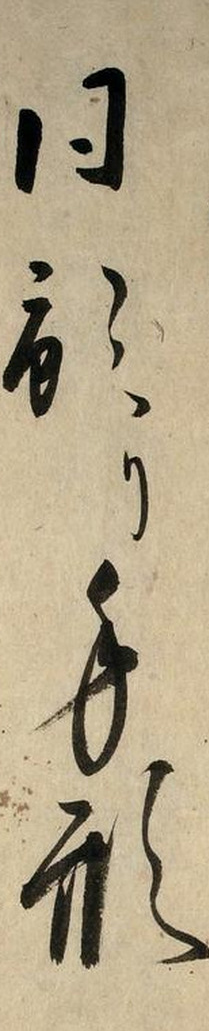同預り手形
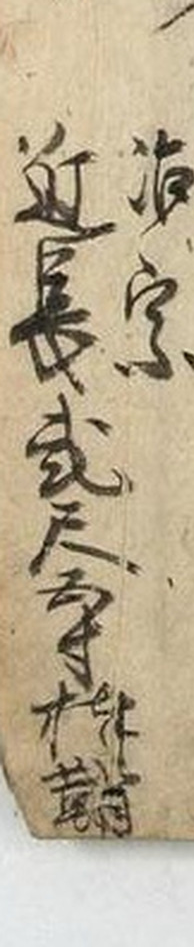近長弐尺五寸棒鞘

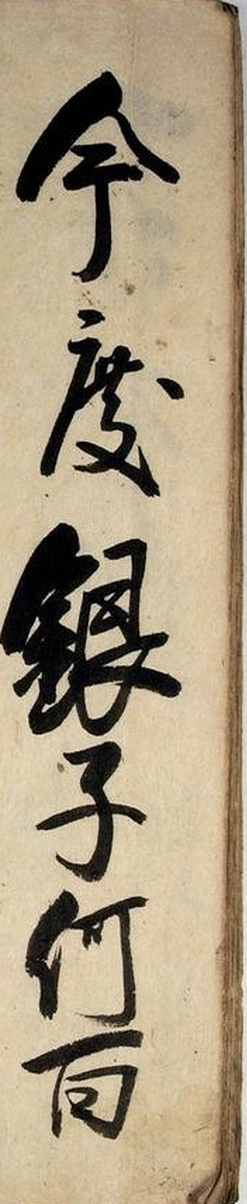今度銀子何百
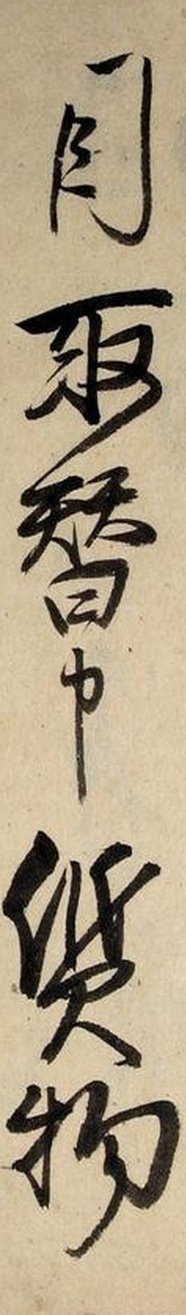目取替申質物
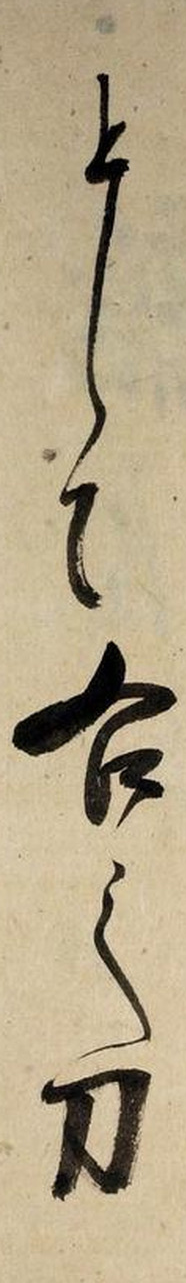として右之刀
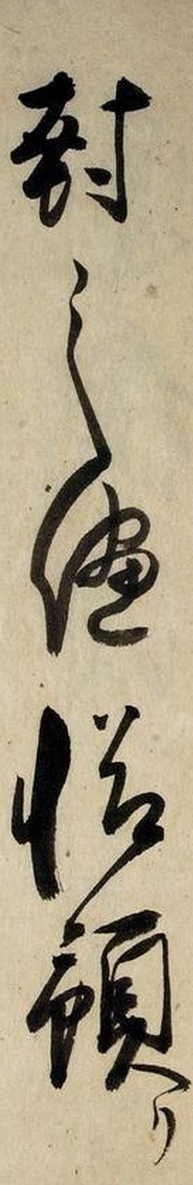対之儘慥預り
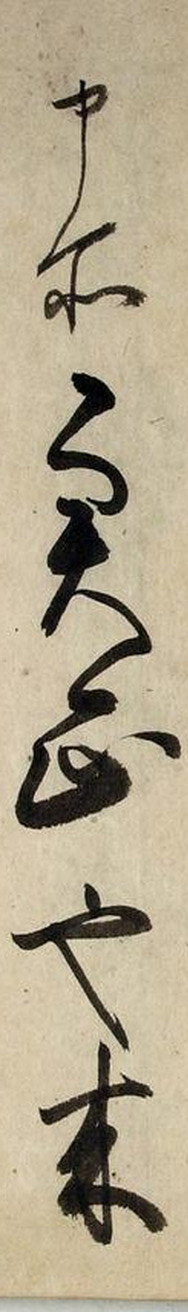申所実正也来
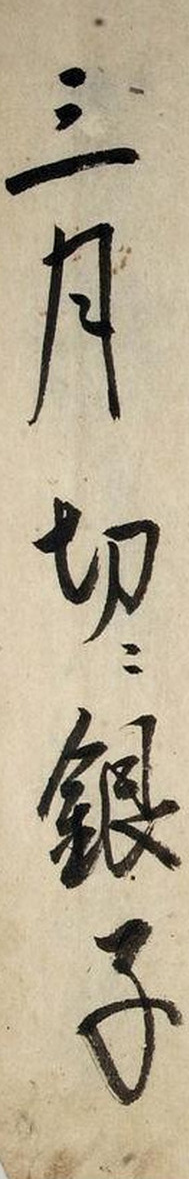三月切に銀子

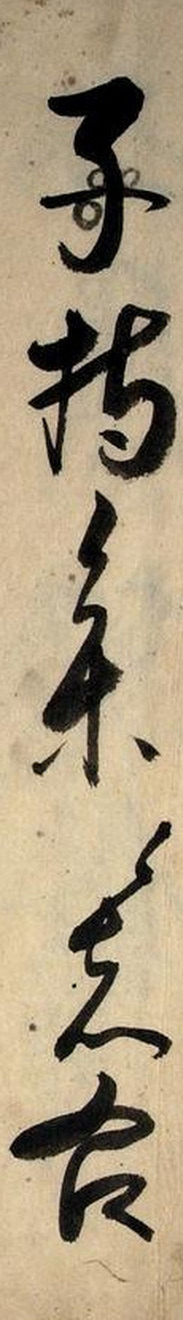子持参候は右
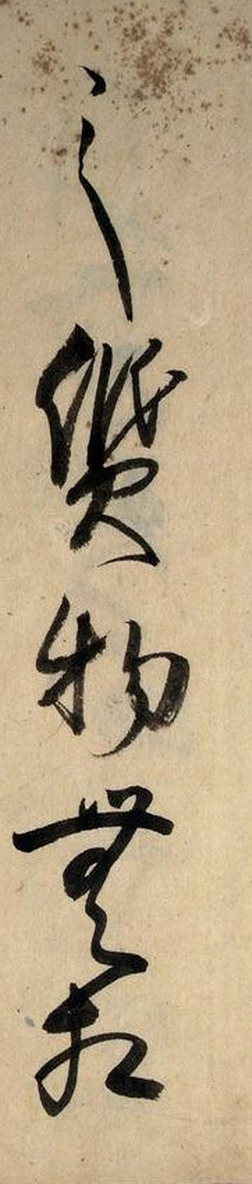之質物無相
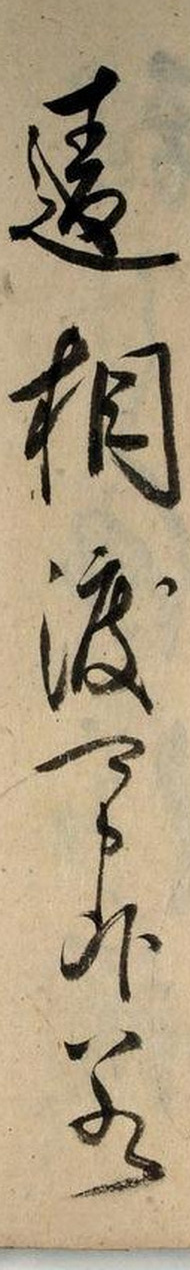違相渡可申候若
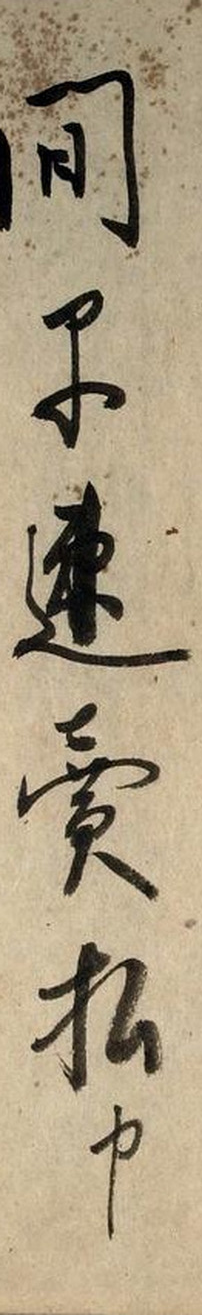間早速売払申
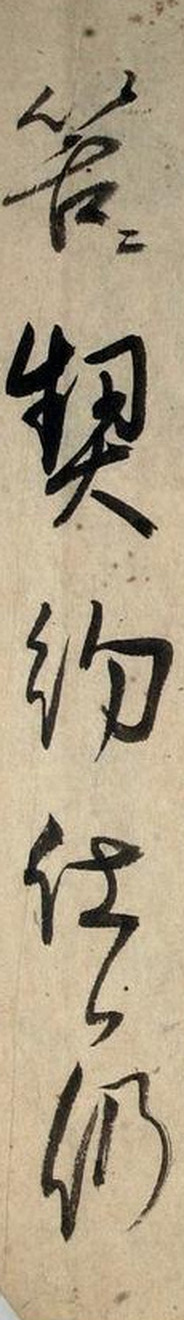筈に契約仕候仍

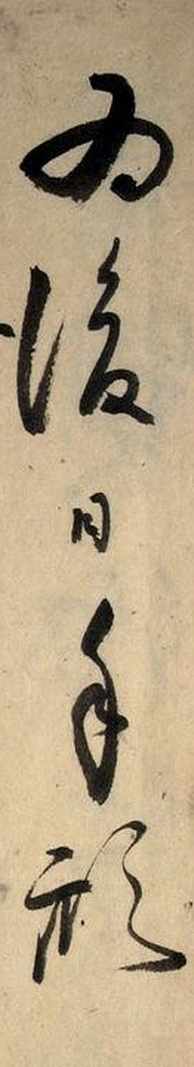為後日手形
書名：御手本（手習、預リ申銀子之事、売渡申家屋敷事ほか）
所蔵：福井県文書館 Fukui Prefectural Archives
